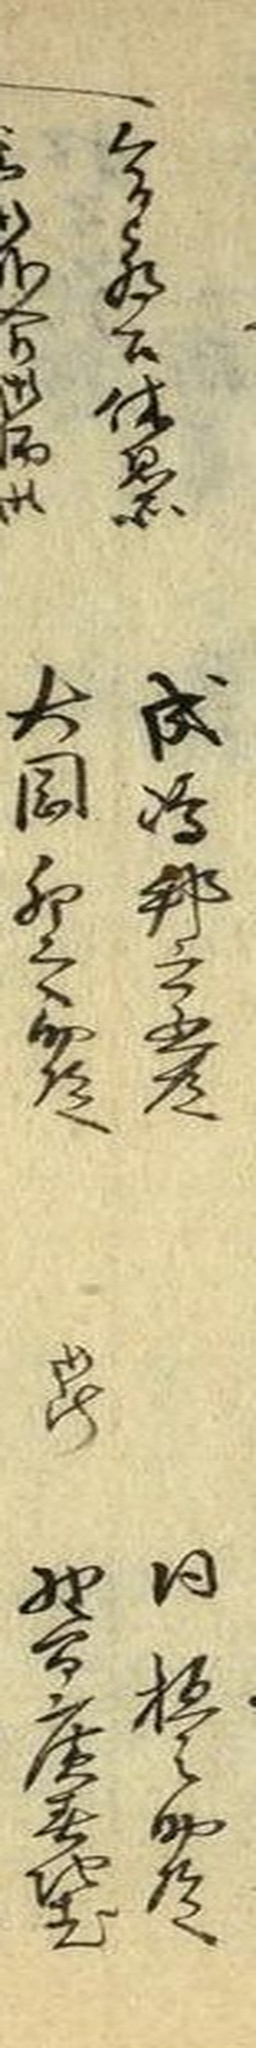ニ而御掛合御酒御大岡卯之助殿同断野間広春院老
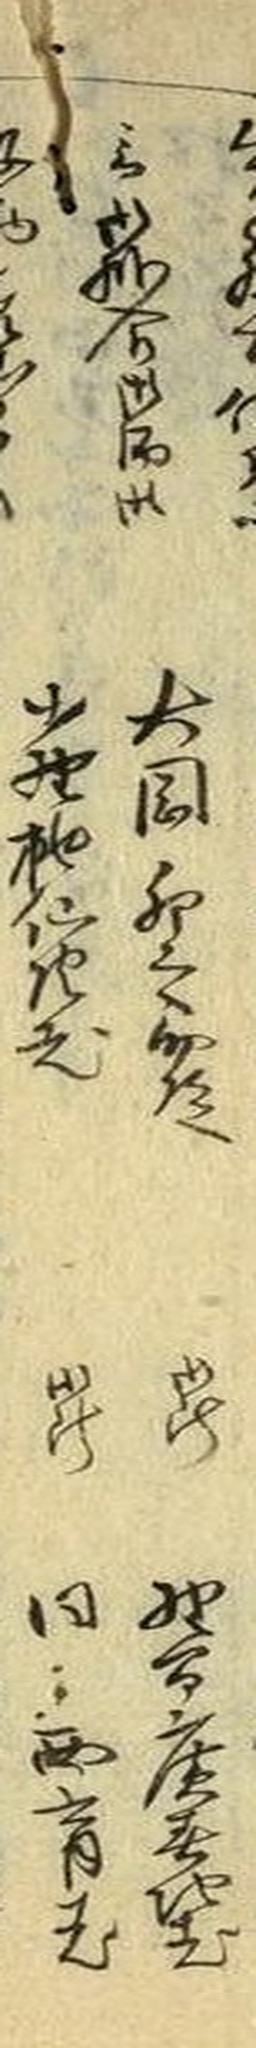吸物差出之小野桃仙院老同断同西育老
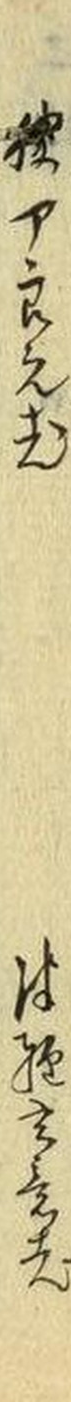服部良元老津軽玄意老
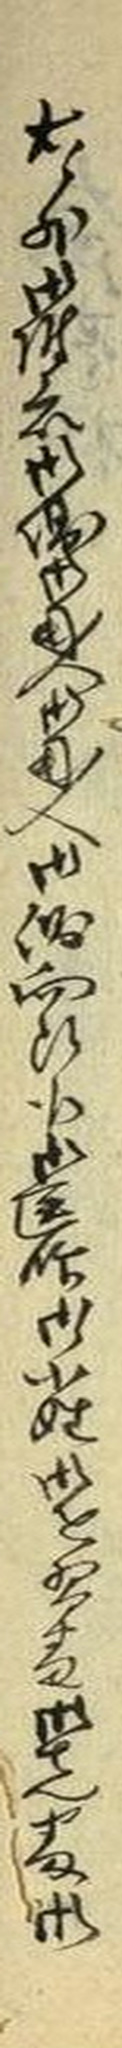右之外御附衆御側御用人御用人御側向頭取御医師御小姓御近習番御先番御
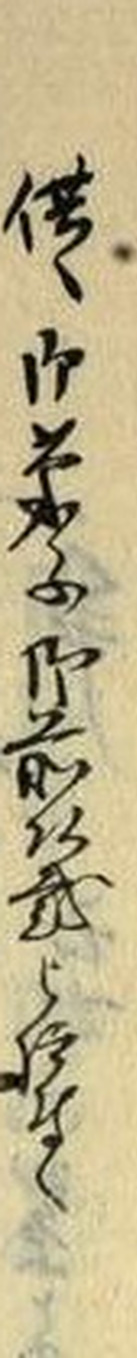供へ御菓子御前頂戴被仰付候
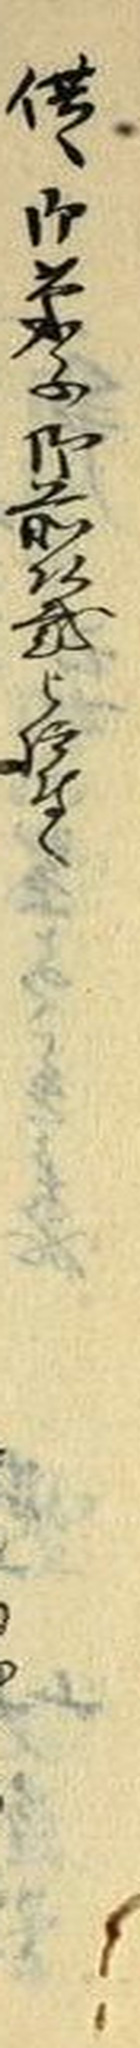供へ御菓子御前頂戴被仰付候
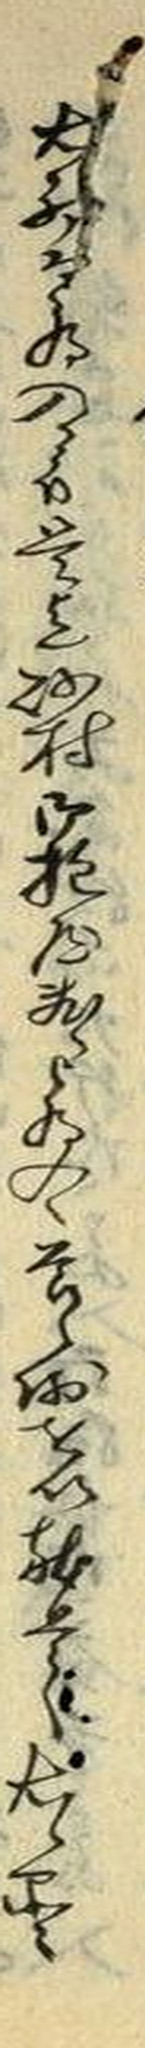右初而被為入候ニ付是迄砂村御抱屋敷へ被為入候節之例を以献上之右之品々
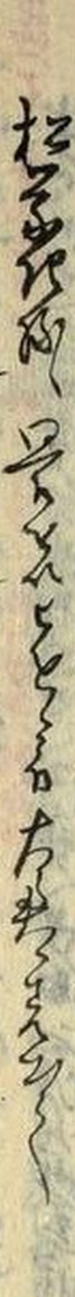松栄院様へ思召を以被進候ニ付右夫々差出之
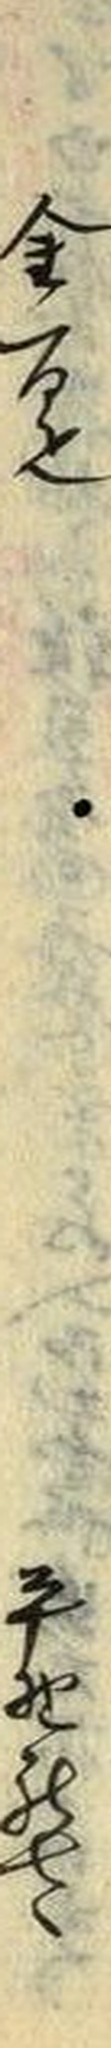金百疋平野新七へ
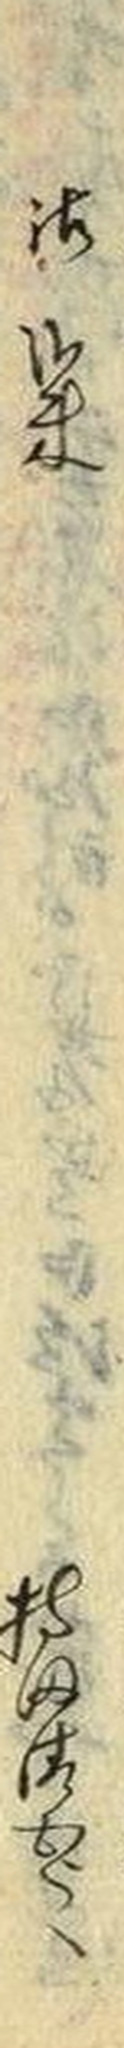銀弐朱持田清五郎へ
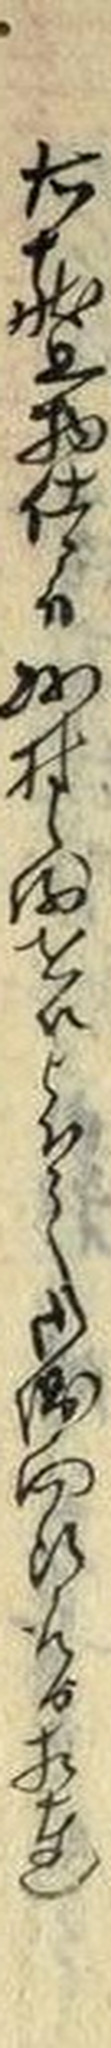右献上物仕候ニ付砂村之例を以被下之御側向頭取ゟ相達
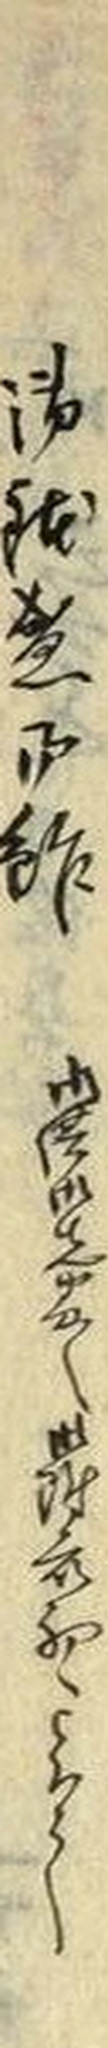御鉢盛御鮓御供御先番之御付衆初へ被下之
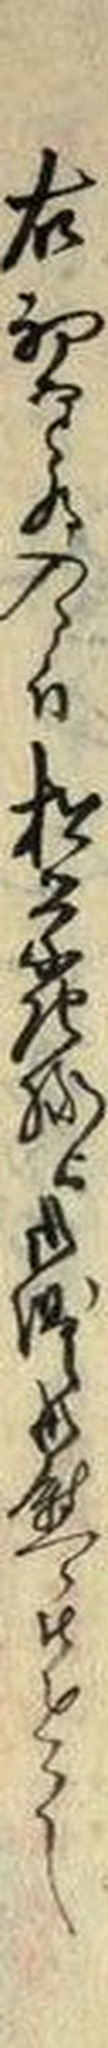右初而被為入候付松栄院様ゟ御側之御慰被進之
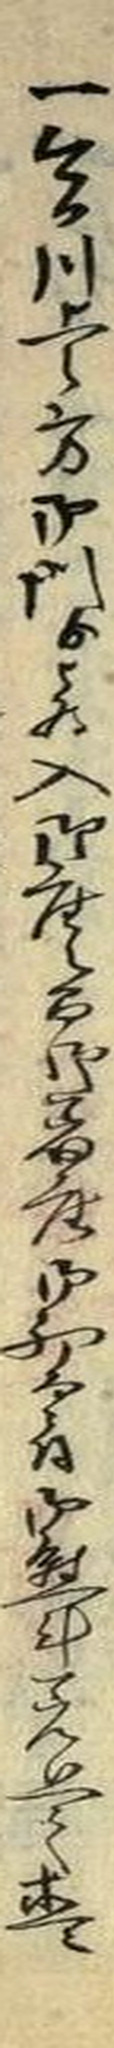一今日川上之方御門ゟ被為入御座之間御着座御初而候ニ付御慰斗差上之直ニ
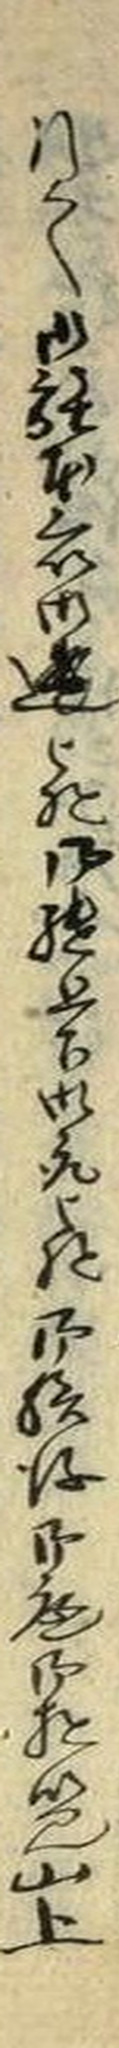引之御旗本衆御逢被遊御継上下御取被遊御膳後御庭御遊覧山上
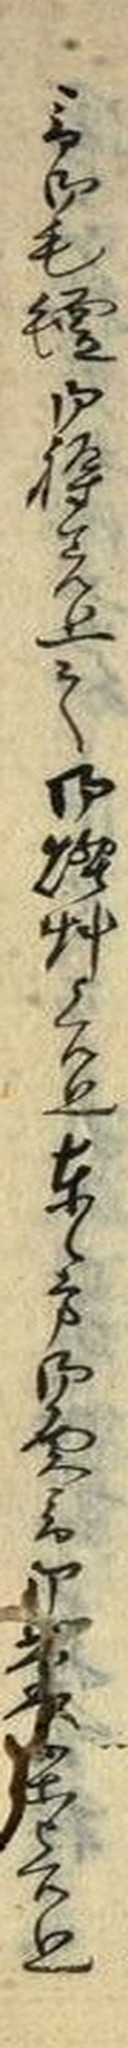ニ而御毛氈御褥差上之御煙草差上東之方御殿ニ而御等被召上
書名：少傅日録抄（斉善付側向頭取日記、江戸并道中、初入在国、逝去後…
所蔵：福井県文書館 Fukui Prefectural Archives
